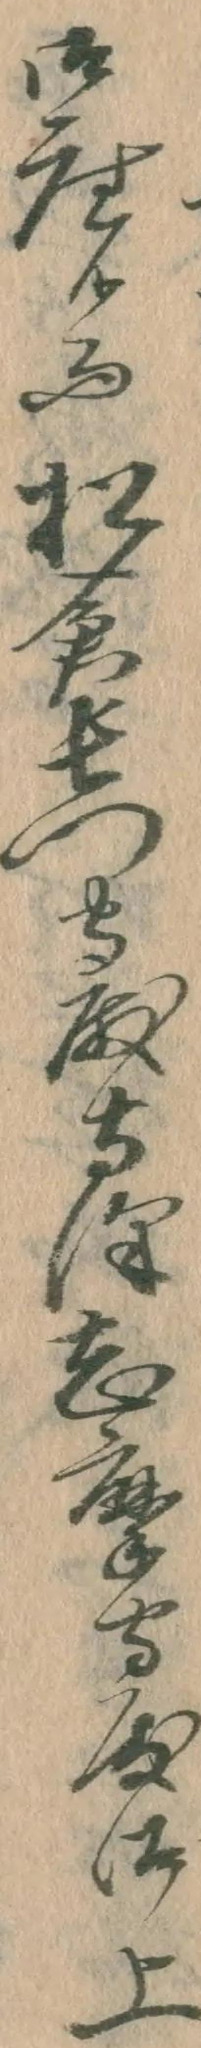御座候而松倉長門守殿寺澤志摩守殿御上
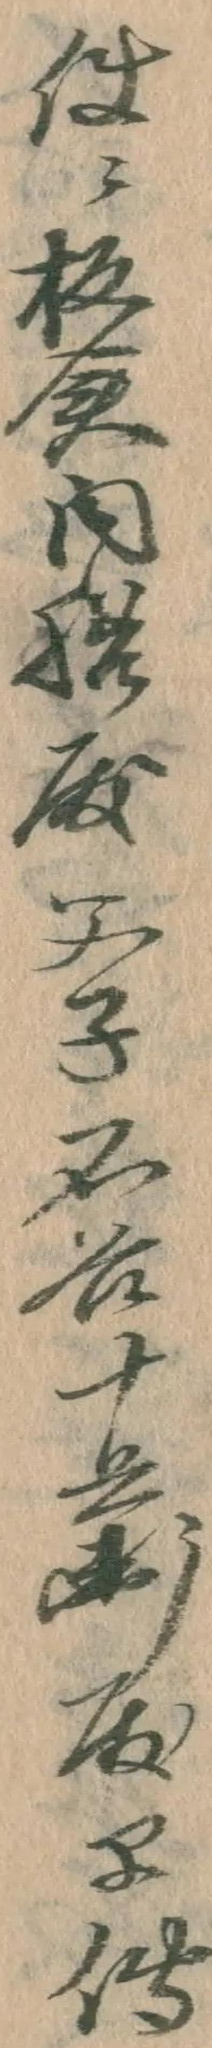使に板倉内膳殿父子石谷十兵衛殿早伝
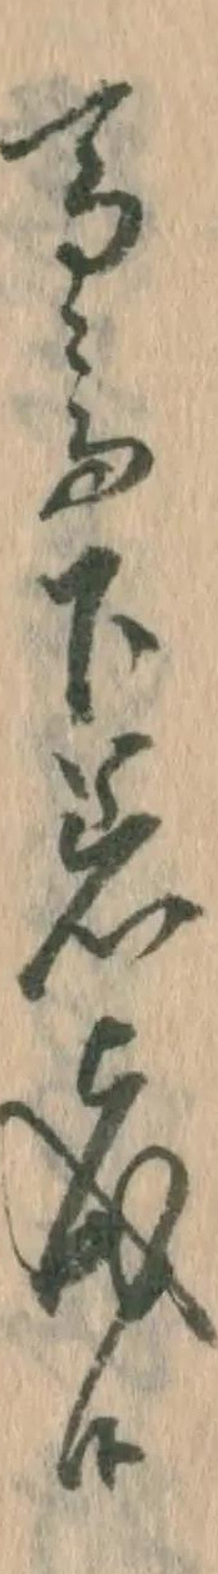馬に而下着被成候
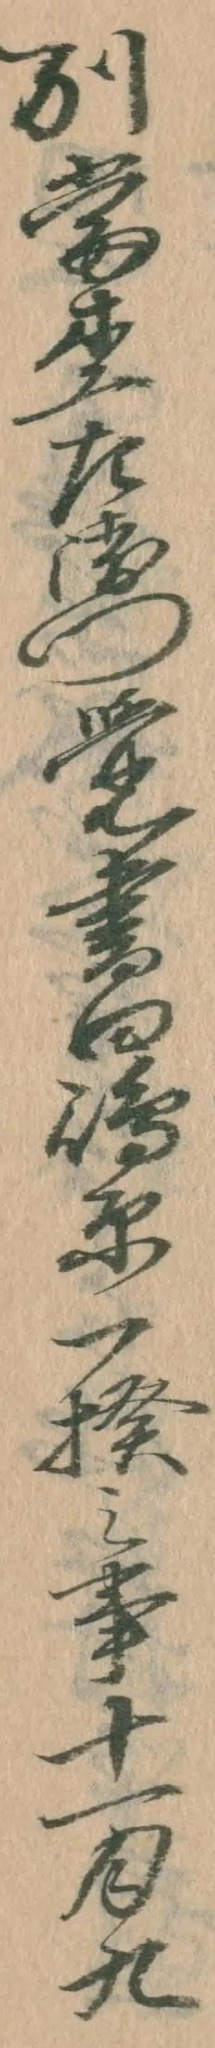別当杢左衛門覚書曰島原一揆之事十一月九
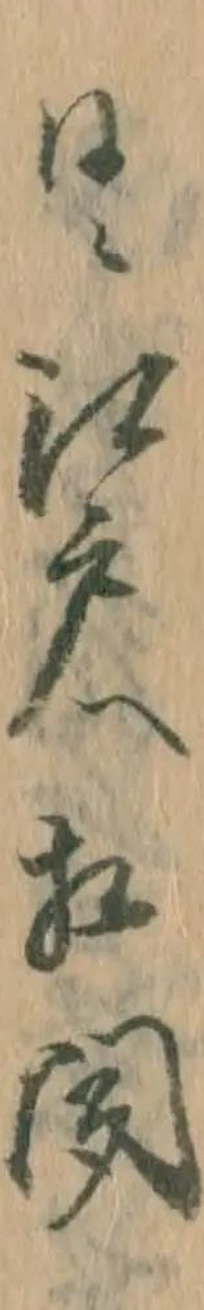日に江戸へ相聞
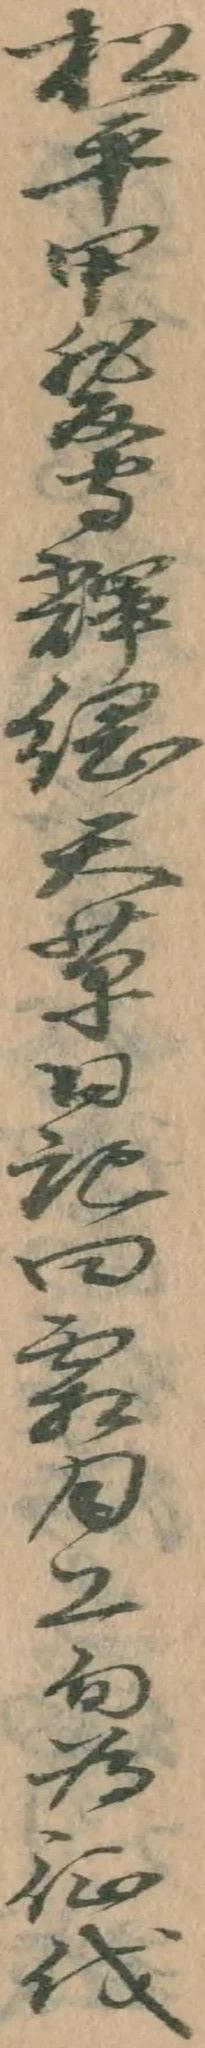松平甲発守輝綱天草日記曰霜月上旬為征伐
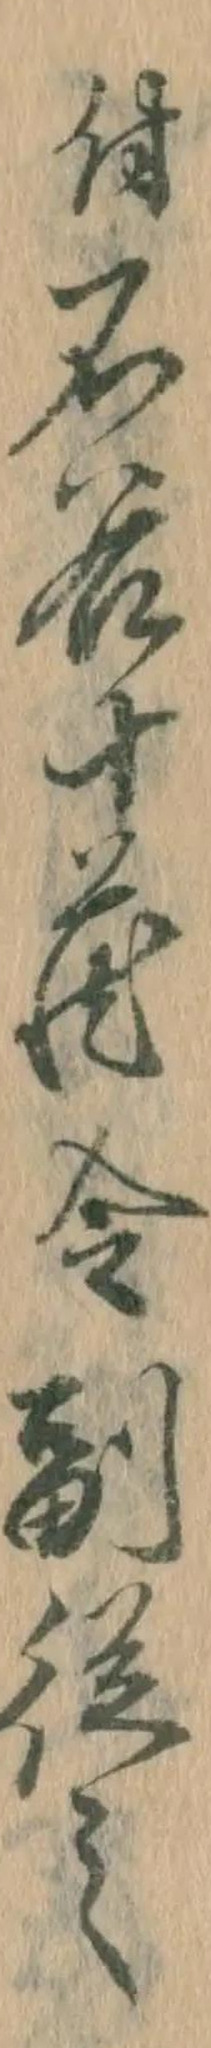付石谷十蔵令副従之
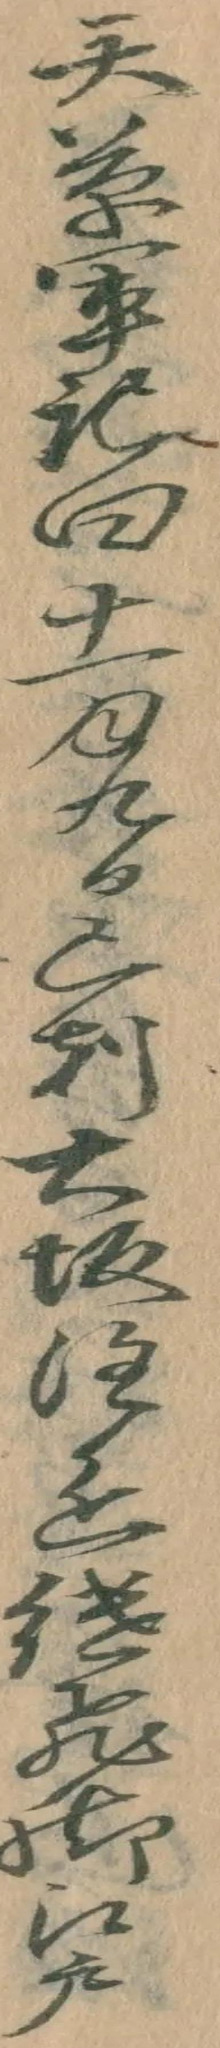天草軍記曰十一月九日巳刻大坂注進鑓飛脚江戸
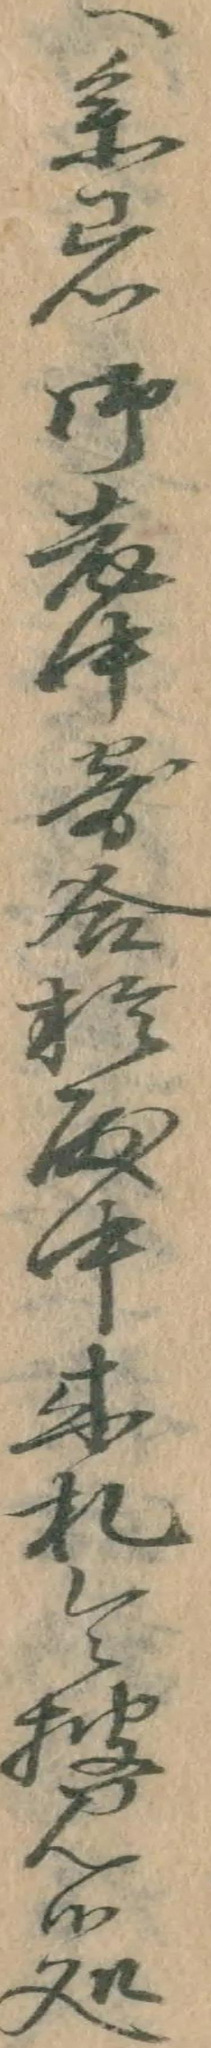へ参着御老中寄合於殿中来札令披見候処
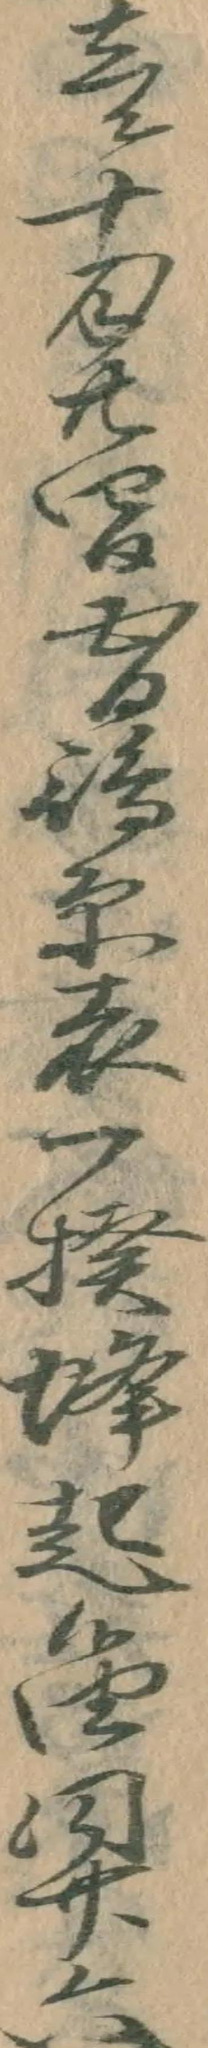去る十月廿四日五日島原表一揆蜂起候由同廿六
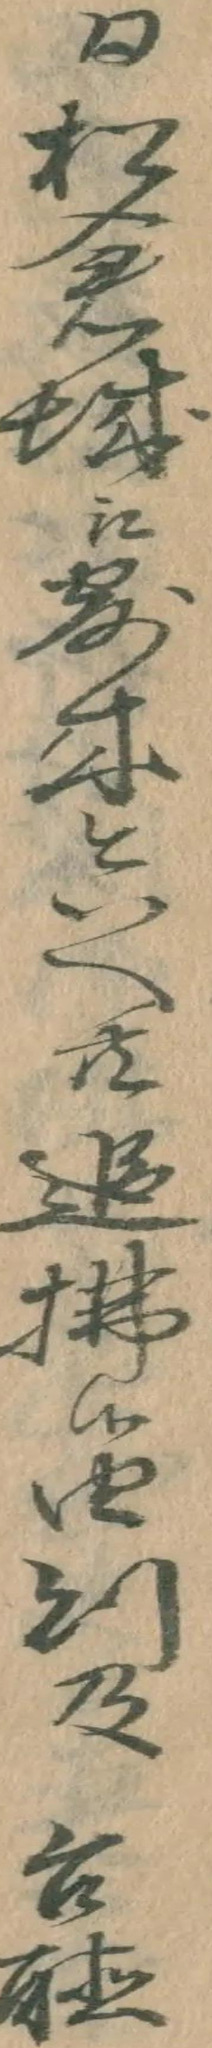日松倉城江寄来といへ共追払候由則及召聴
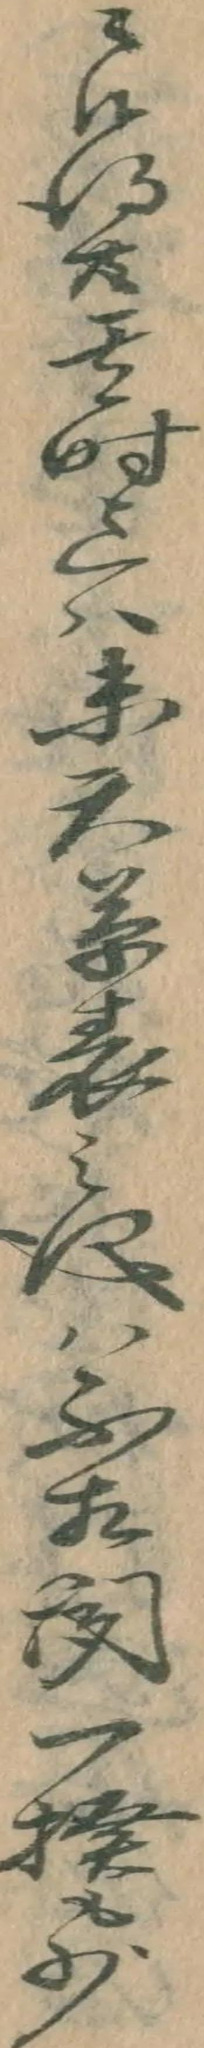に候得共其時迄は未天草表之儀は不相聞一揆も少
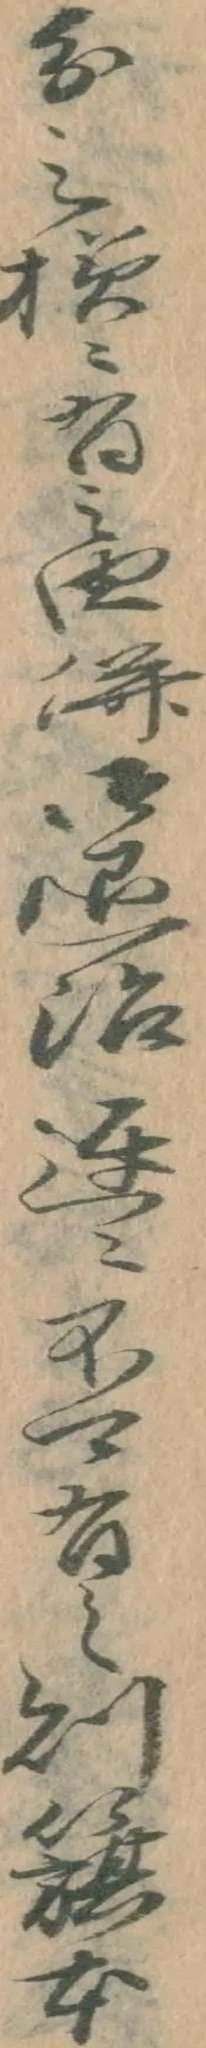分之様に有之由併御退治遅々不可有之則籏本

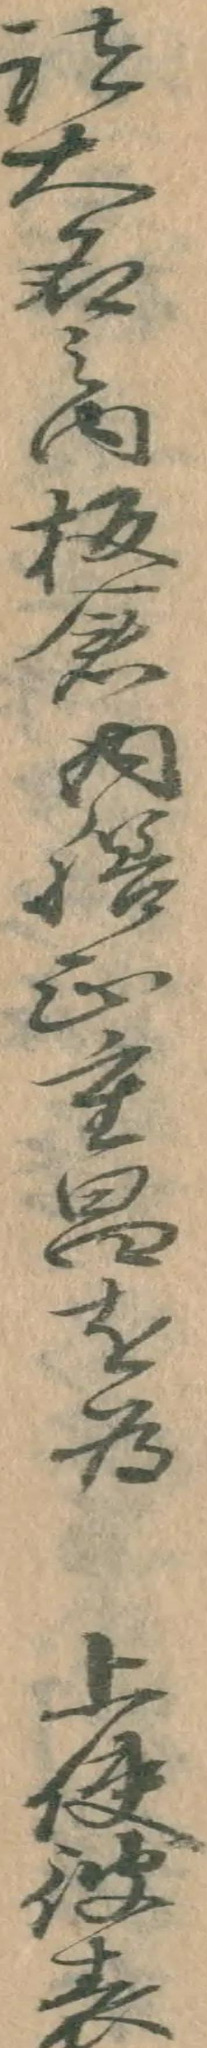諸大名之内板倉内膳正重昌を為上使彼表
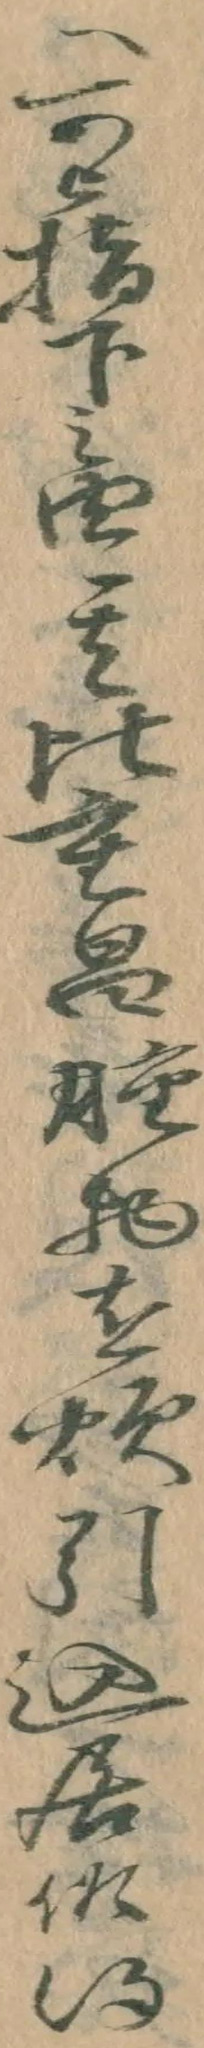へ可被指下之由其比重昌腫物を煩引込居候得
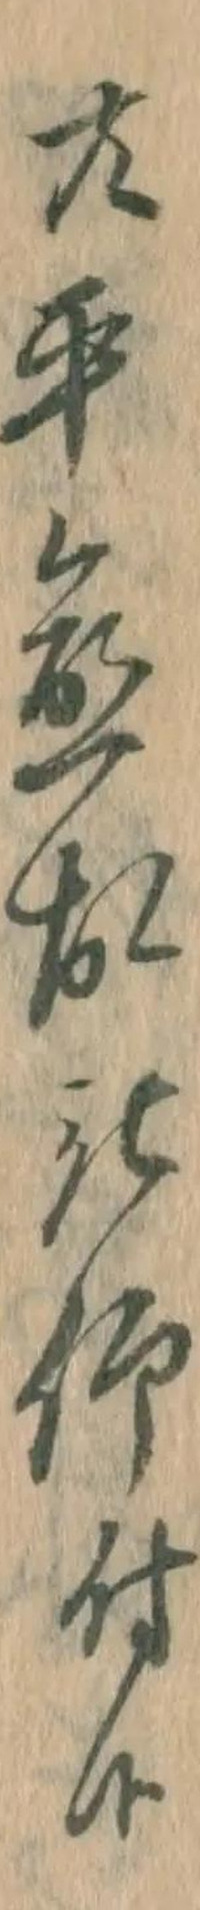共平愈故被仰付候
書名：切支丹御退治記 49巻. [2]
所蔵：国立国会図書館 National Diet Library, JAPAN
